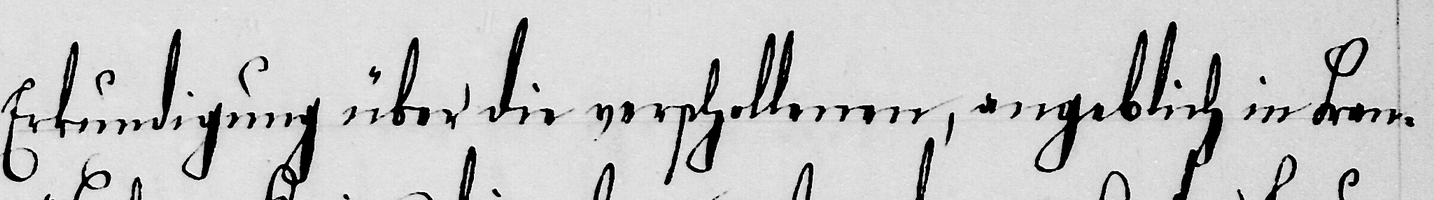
Erkundigung über die verschollenen, angeblich in Fra¬
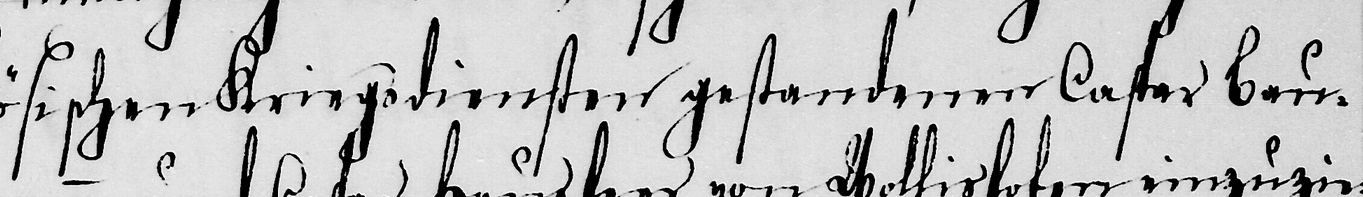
sischen Kriegsdiensten gestandenen Caspar Bau¬
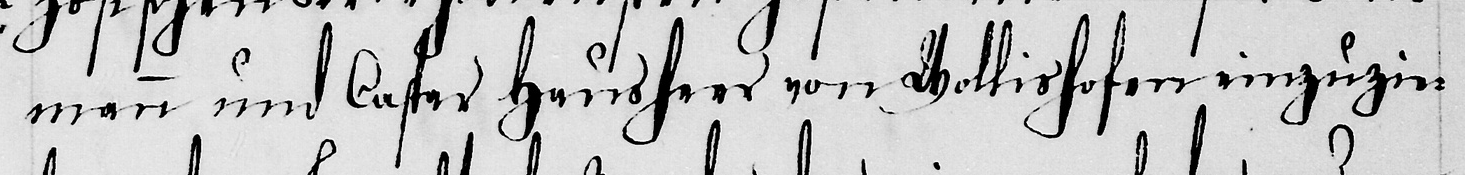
mann und Caspar Hausheer von Wollishofen einzuzie¬
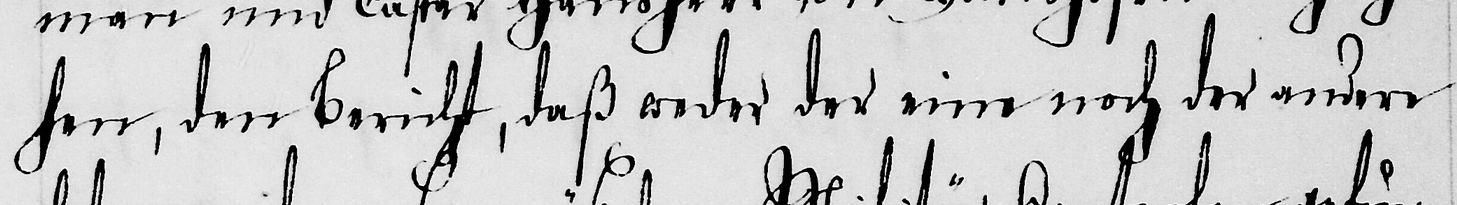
hen, den Bericht, daß weder der eine noch der andere
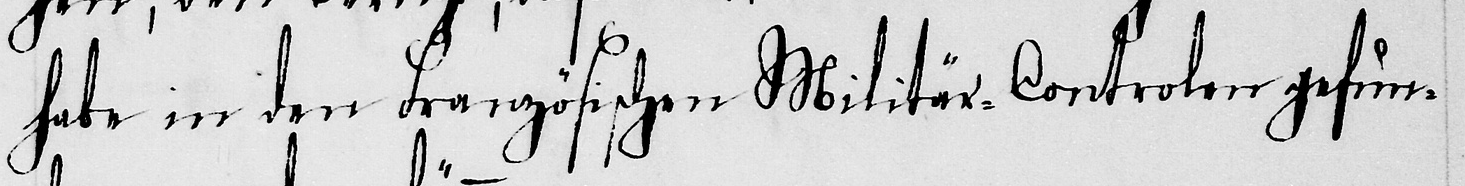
habe in den Französischen Militär-Controlen gefun¬
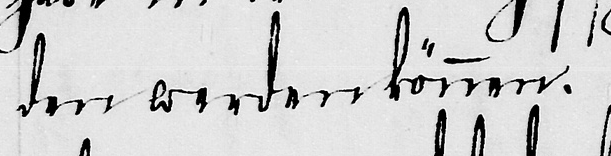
den werden können.
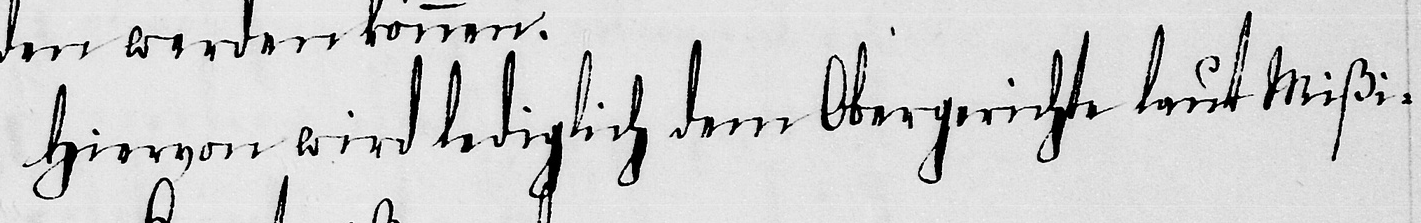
Hiervon wird lediglich dem Obergerichte laut Mißi¬
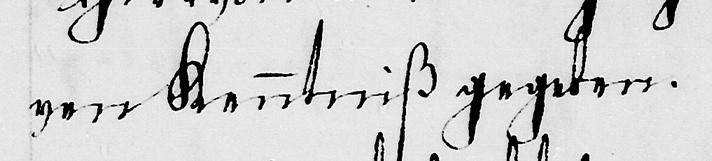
ven Kenntniß gegeben.
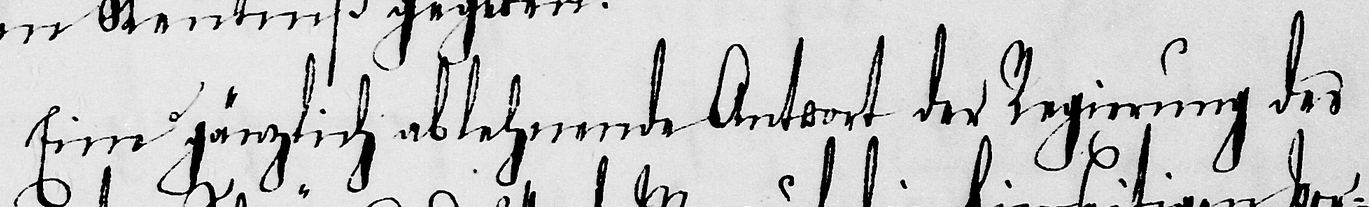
Eine gänzlich ablehnende Antwort der Regierung des
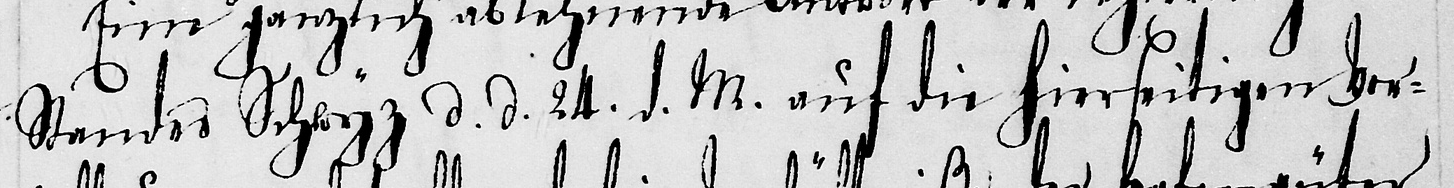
Standes Schwyz d. d. 24. d. M. auf die hierseitigen Vors¬
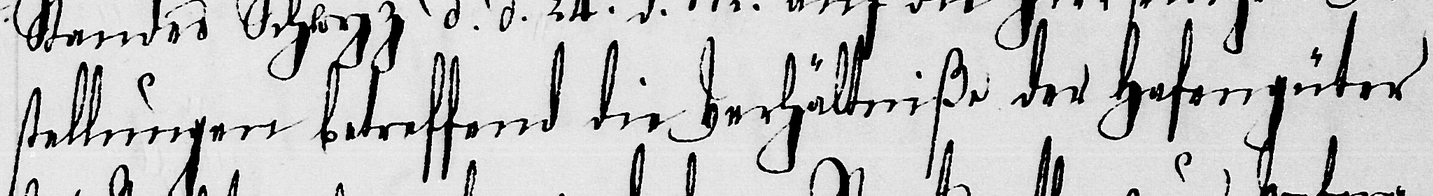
tellungen betreffend die Verhältniße der Hafengüter
